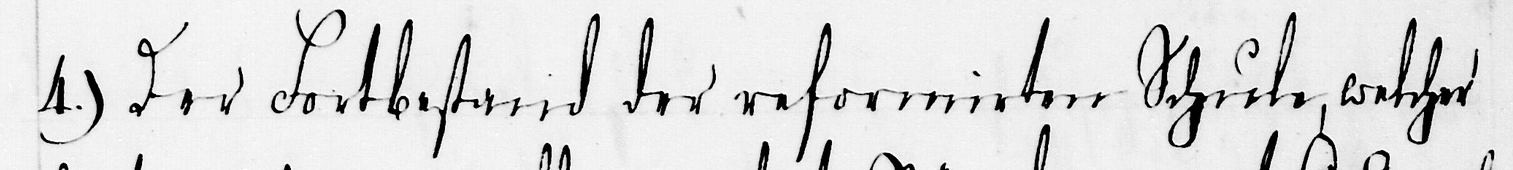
4.) Der Fortbestand der reformirten Schule, welcher
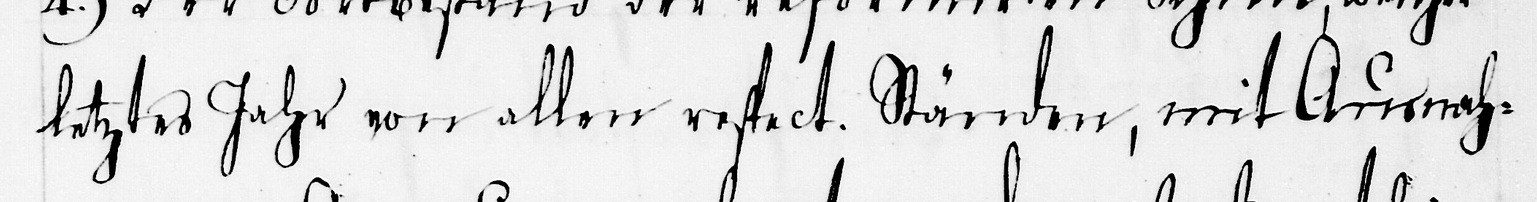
letztes Jahr von allen respect. Ständen, mit Ausnah¬
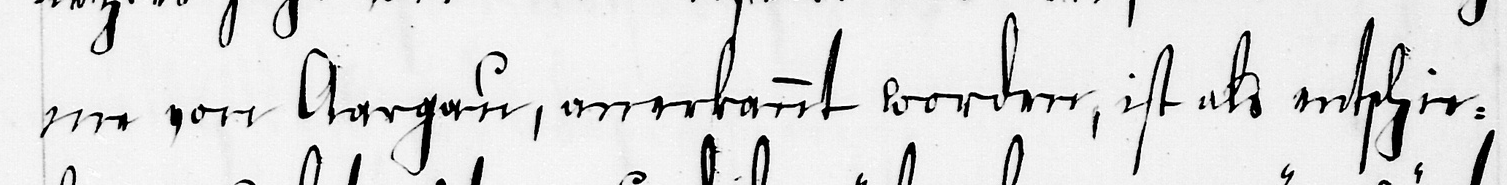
me von Aargau, anerkannt worden, ist als entschie¬
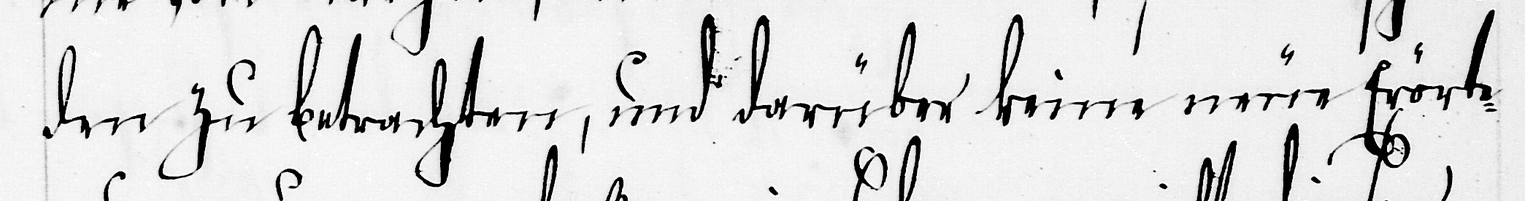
den zu betrachten, und darüber keine neue Erörte¬
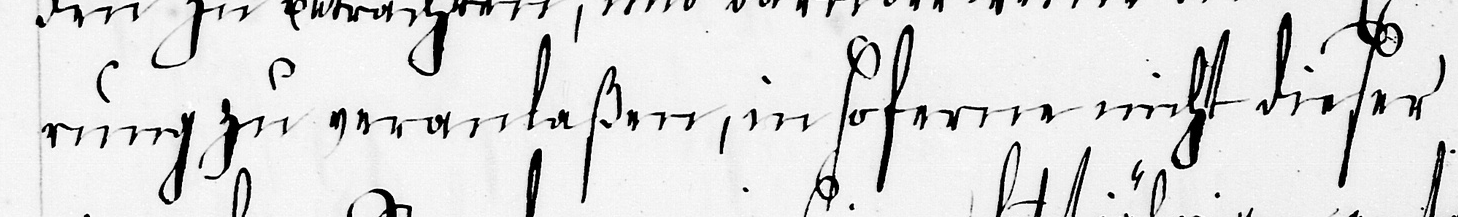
rung zu veranlaßen, in soferne nicht dieser
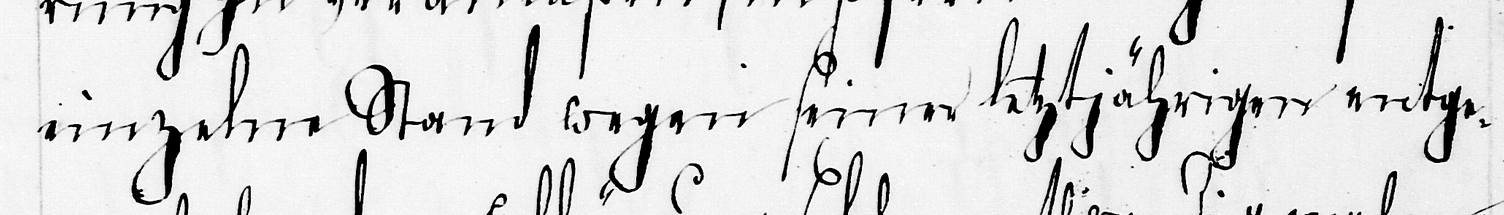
einzelne Stand wegen seiner letztjährigen entge¬
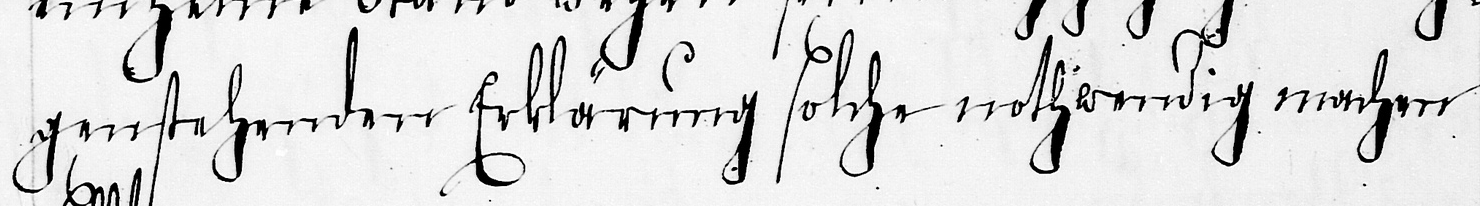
genstehenden Erklärung solche nothwendig machen
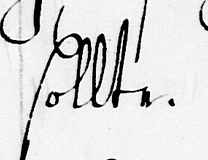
sollt¬
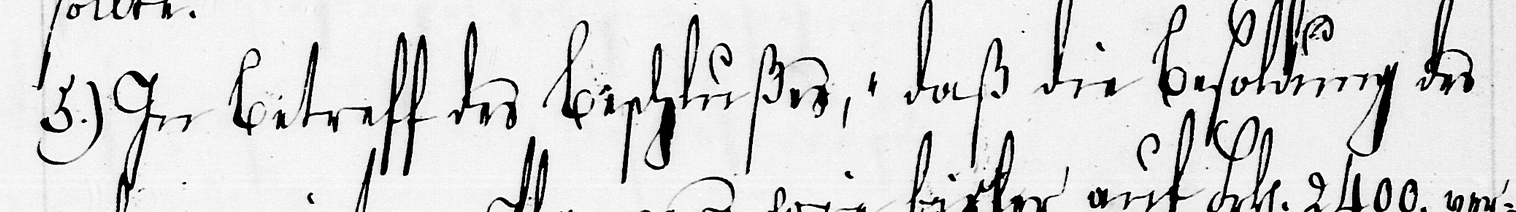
5.) In Betreff des Beschlußes, „daß die Besoldung des
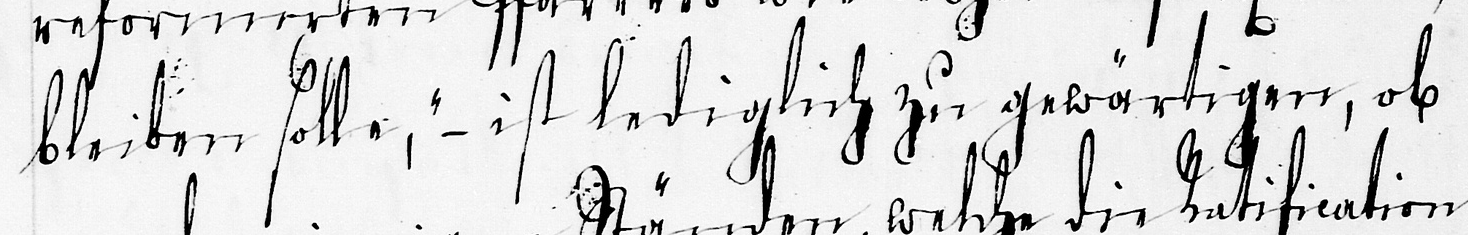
bleiben solle,“ – ist lediglich zu gewärtigen, ob
